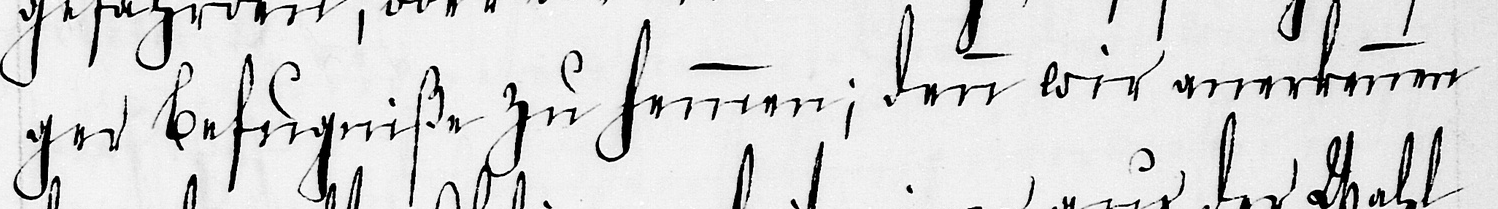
ger Befugniße zu hemmen; denn wir anerkennen
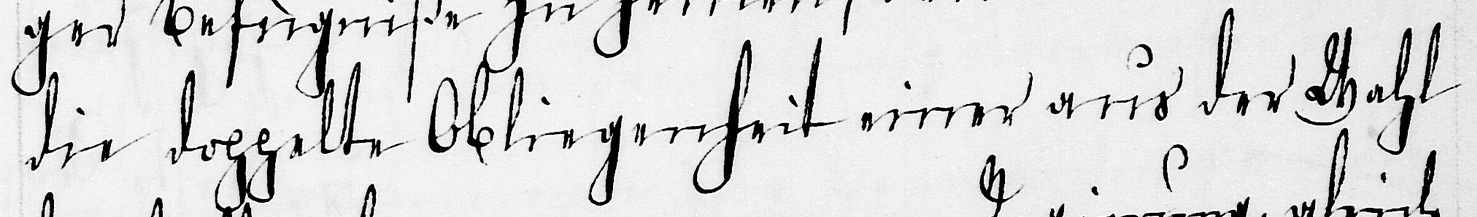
die doppelte Obliegenheit einer aus der Wahl
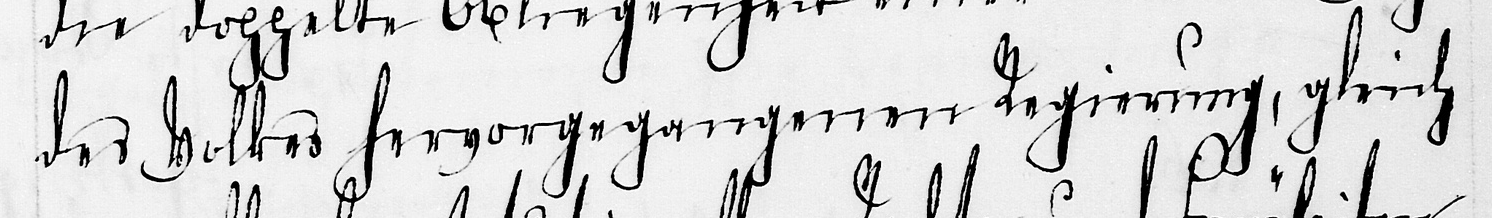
des Volkes hervorgegangenen Regierung, gleich
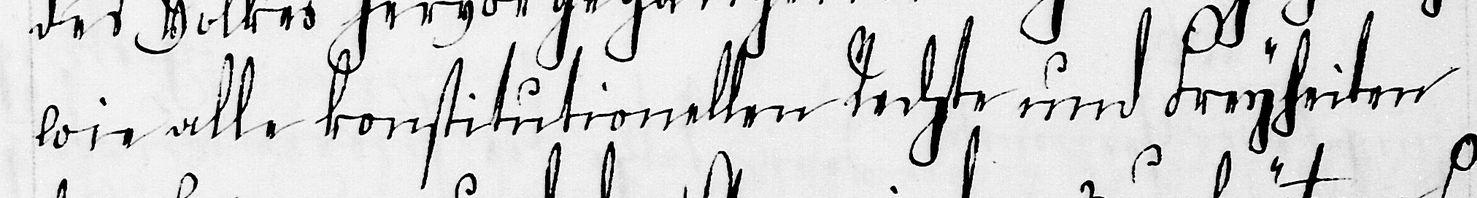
wie alle konstitutionellen Rechte und Freyheiten
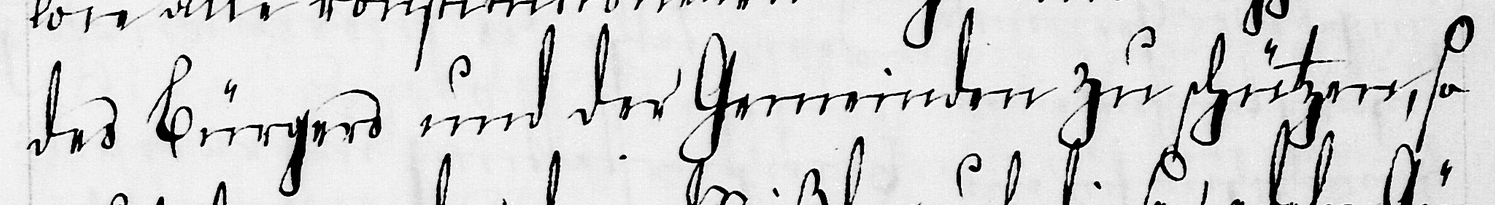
des Bürgers und der Gemeinden zu schützen, so
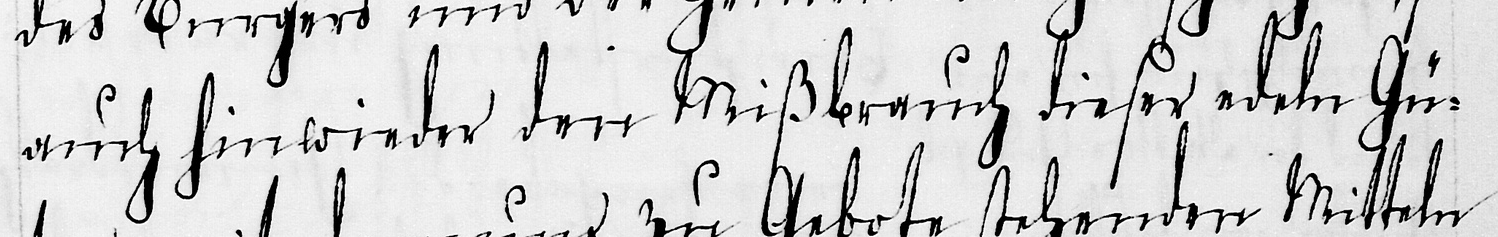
auch hinwieder den Mißbrauch dieser edeln Gü¬
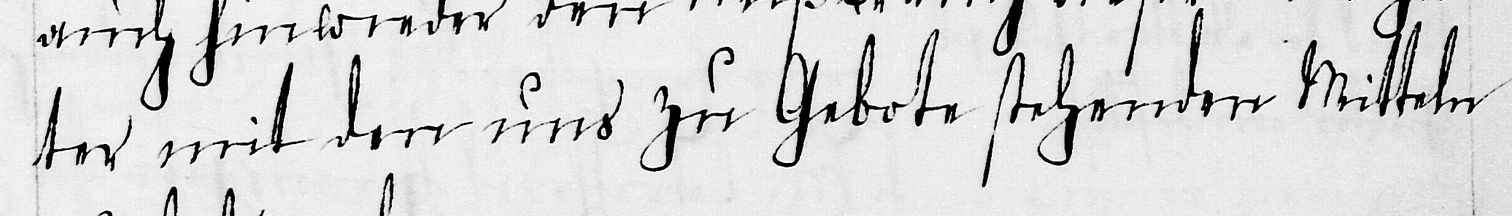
ter mit den uns zu Gebote stehenden Mitteln
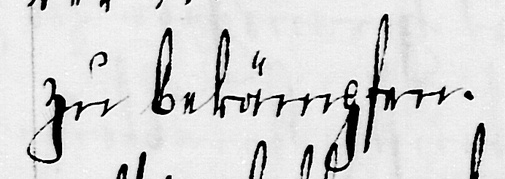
zu bekämpfen.
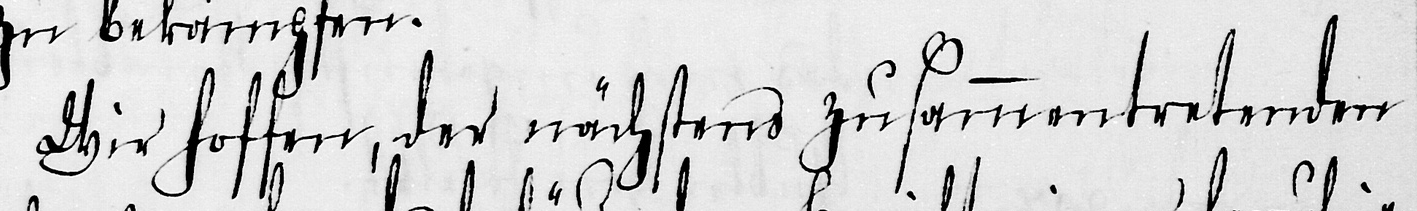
Wir hoffen, der nächstens zusammentretenden
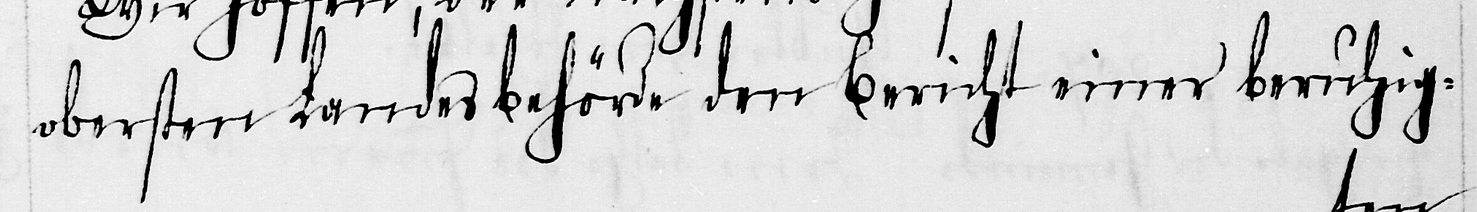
obersten Landesbehörde den Bericht einer beruhig-
